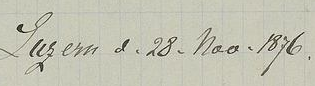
Luzern d. 28. Nov. 1876.
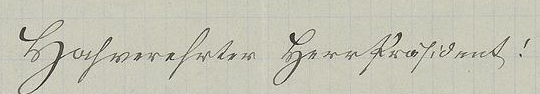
Hochverehrter Herr Präsident!
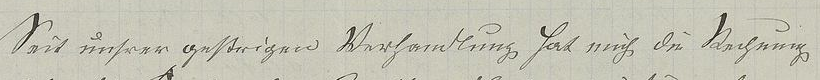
Seit unsrer gestrigen Verhandlung hat mich die Rechnung
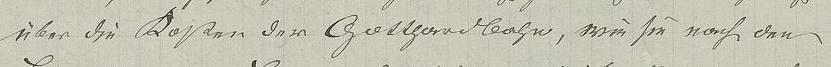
über die Kosten der Gotthardbahn, wie sie nach den
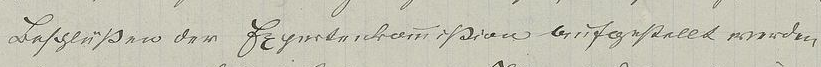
Beschlüßen der Expertenkommißion aufgestellt werden
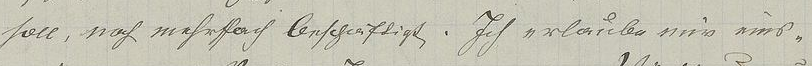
soll, noch mehrfach beschäftigt. Ich erlaube mir eins-
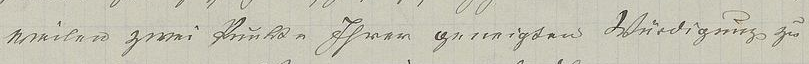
weilen zwei Punkte Ihrer geneigten Würdigung zu
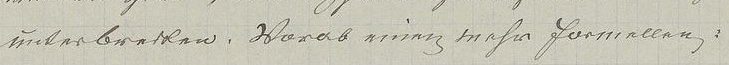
unterbreiten. Vorab einen mehr formellen:
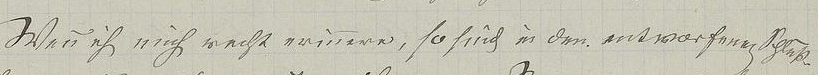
Wenn ich mich recht erinnere, so sind in den entworfenen Schluß-
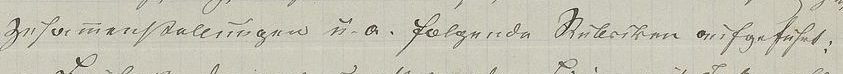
zusammenstellungen u. a. folgende Rubriken aufgeführt:
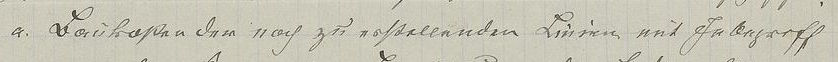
a. Baukosten der noch zu erstellenden Linien mit Inbegriff
